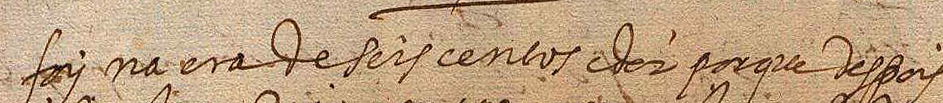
foy na era de seiscentos e dez porque despois
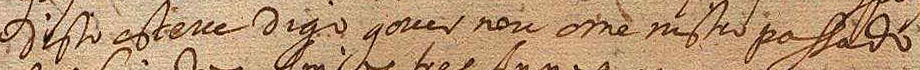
disto esteue digo gouernou o menistro passado
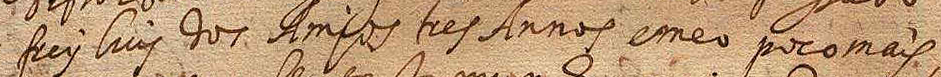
frey luis dos Amjos tres Annos e meo poco mais
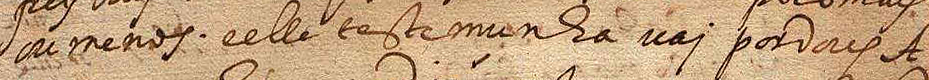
ou menos. e elle testemunha uaj por dous A
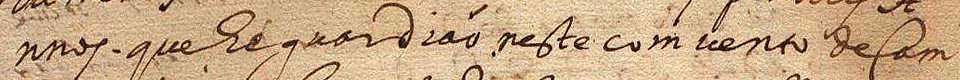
nnos. que he guardiaõ neste comuento de Cam
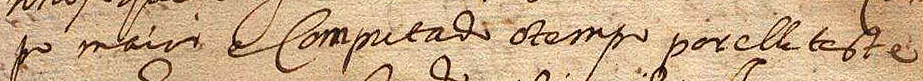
po maior e Computado o tempo por elle teste
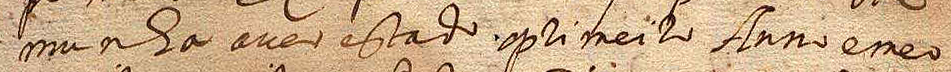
munha auer estado o primeiro Anno e meo
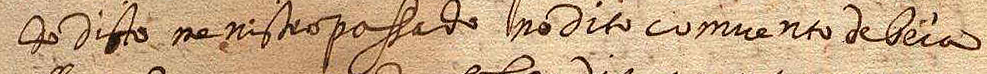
do di_to menistro passado no dito comuento de beia
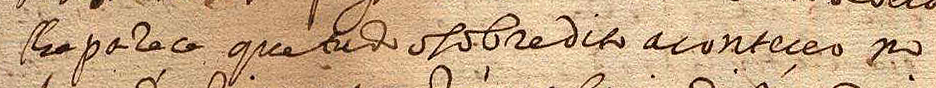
lhe parece que tudo o sobredito aconteceo no
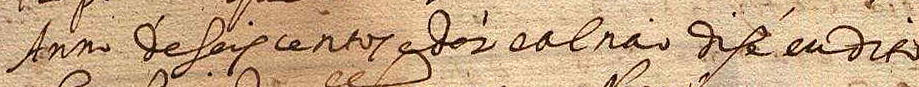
Anno de seiscentos e dez e al nao dise eu dito
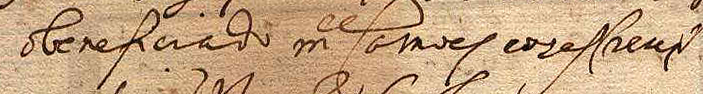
o beneficiado mel Camoes e os esCreuj
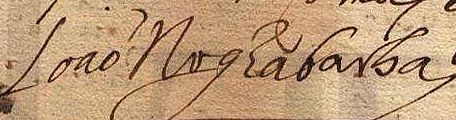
Joaõ NogRa barba
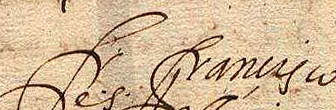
fr francisco
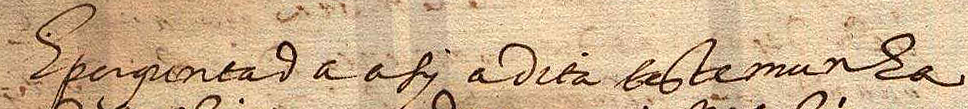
E perguntada asy a dita testemunha
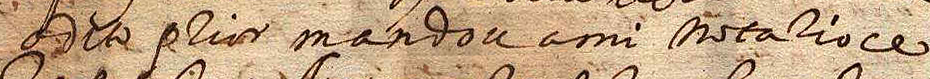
o dito pRior mandou a mi notario ce
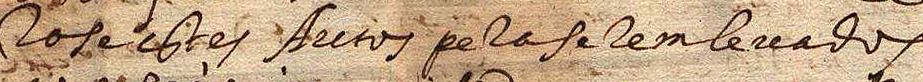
ras e estes Autos pera serem leuados
